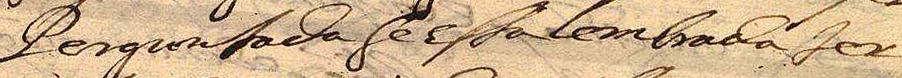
Perguntada se Esta lembrada ter
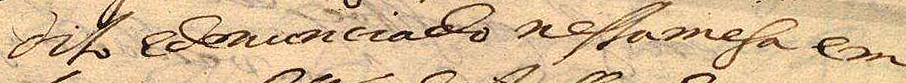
dito E denunciado nesta mesa em
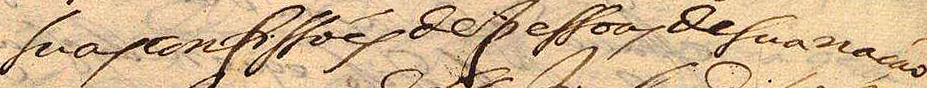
suas confissoẽs de pessoas de sua naçaõ
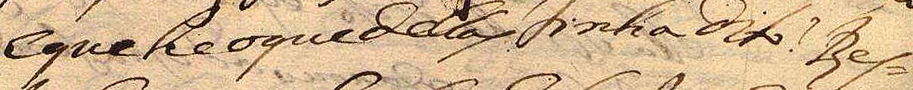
e que he o que dellas tinha dito? Res
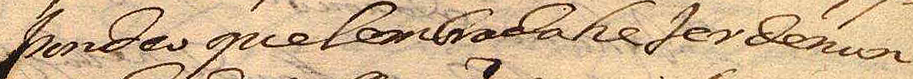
pondeo que lembrada he ter denun
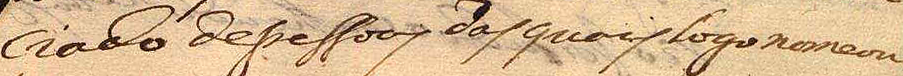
çiado de pessoas das quais logo nomeou
